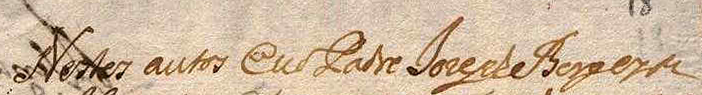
Nestes autos eu o Padre Iozeph Borges de
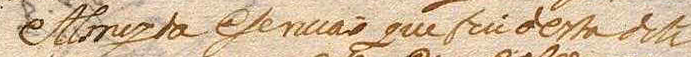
Almeyda escriuaõ que fui desta dili
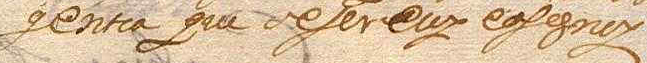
gensia que o escreuy e asegney
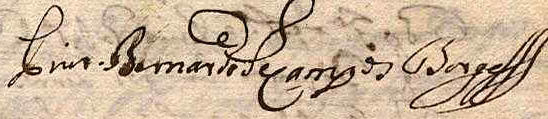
Prior. Bernardo de Campos Borges
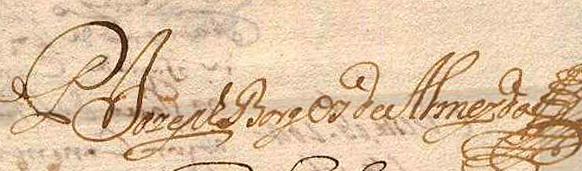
o P Jozeph Borges de Almeyda
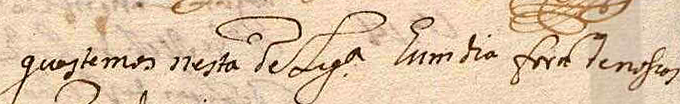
guastemos nesta deLig.a hum dia fora de nossas
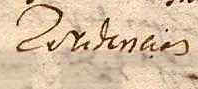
Rezidencias
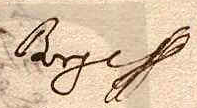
Borges
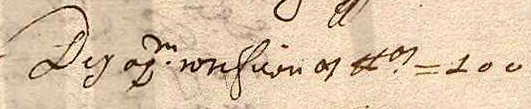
Dey a q.m noteficou as tt.as =100
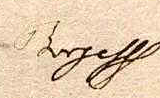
Borges
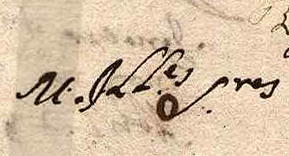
M. Ill.es S.res
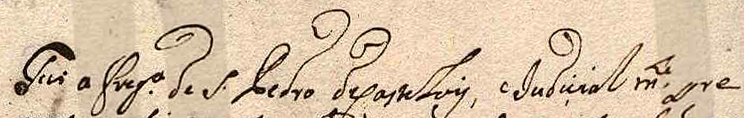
Fui a freg.a de S. Pedro de CasteLois, e Iudcialm.te pre
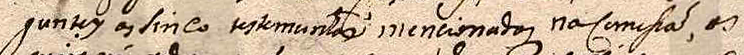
guntey as sinco testemunhas mencionadas na Comissaõ, os
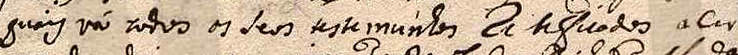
quais vaõ todos os seos testemunhos Rateficados aCer
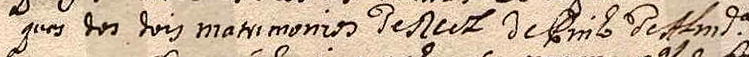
quas dos dois matrimonios de MeL de Pinho de Almd.a
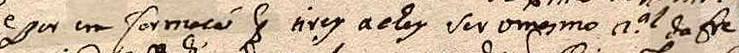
e por emformaçaõ q̄ tirey achey ser o mesmo n.al da fre
